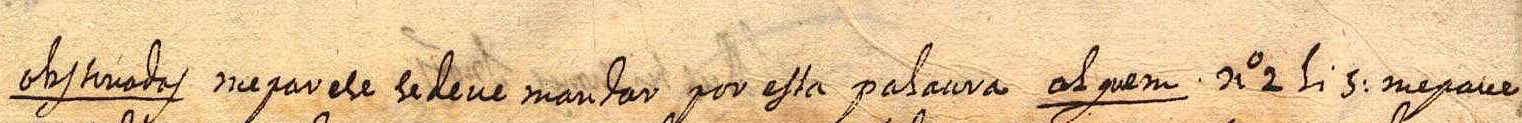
obstinadas me parese se deue mandar por esta palaura alguem. no 2 Li 5: me pare
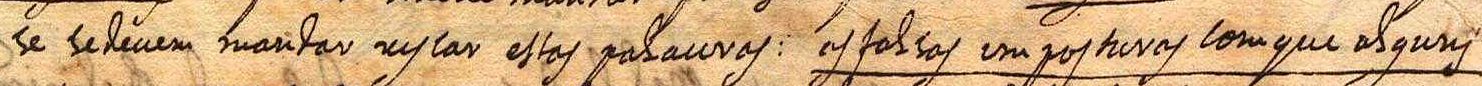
se se deuem mandar riscar estas palauras: as falsas imposturas com que alguns
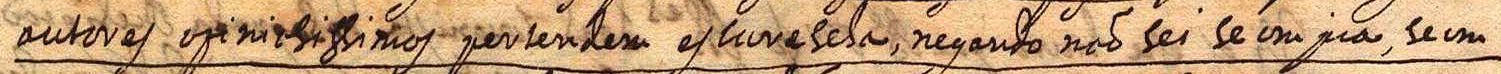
autores opiniosissimos pertendem escuresela, negando naõ sei se impia, se im
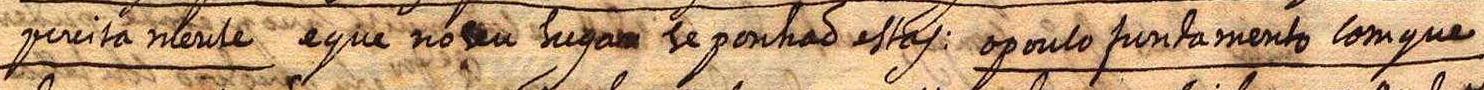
peritamente e que no seu lugar se ponhaõ estas: o pouco fundamento com que
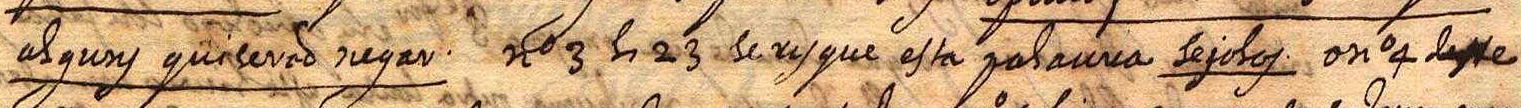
alguns quiseraõ negar. no 3 li 23 se risque esta palaura sejolos. o no 4 deste
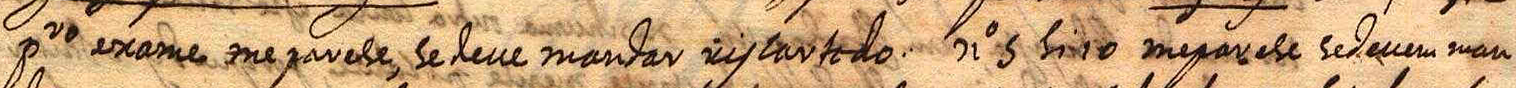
pro exame me parese, se deue mandar riscar todo. no 5 li 10 me parese se deuem man
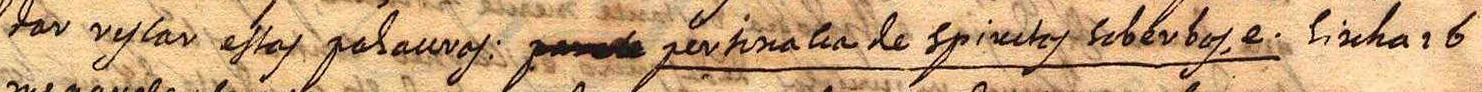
dar riscar estas palauras: parese pertinacia de spiritos soberbos, e. linha 16
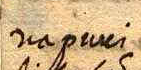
na puri
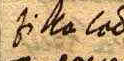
ficaçaõ
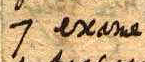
7 exame
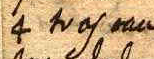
4 tras o au
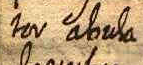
tor a bula
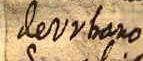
de vrbano
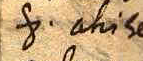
8. ahi se
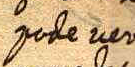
pode uer
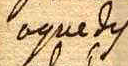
o que dis
